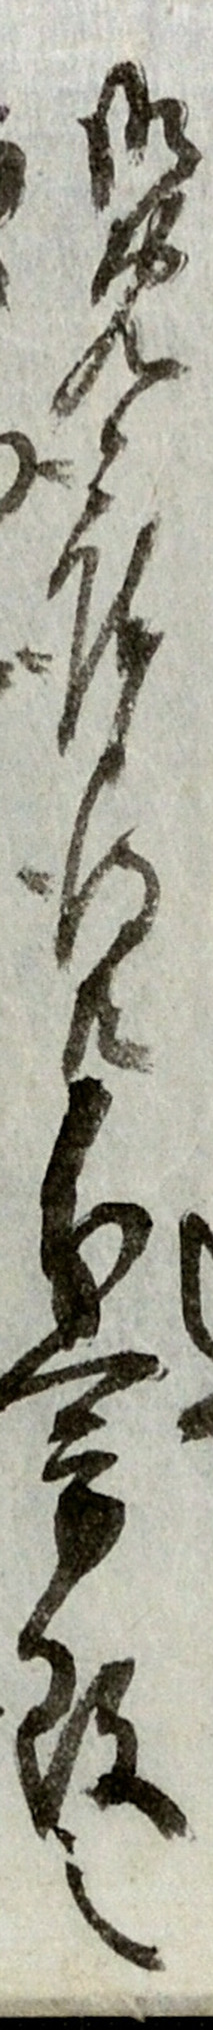御免御座候得共分一方改之
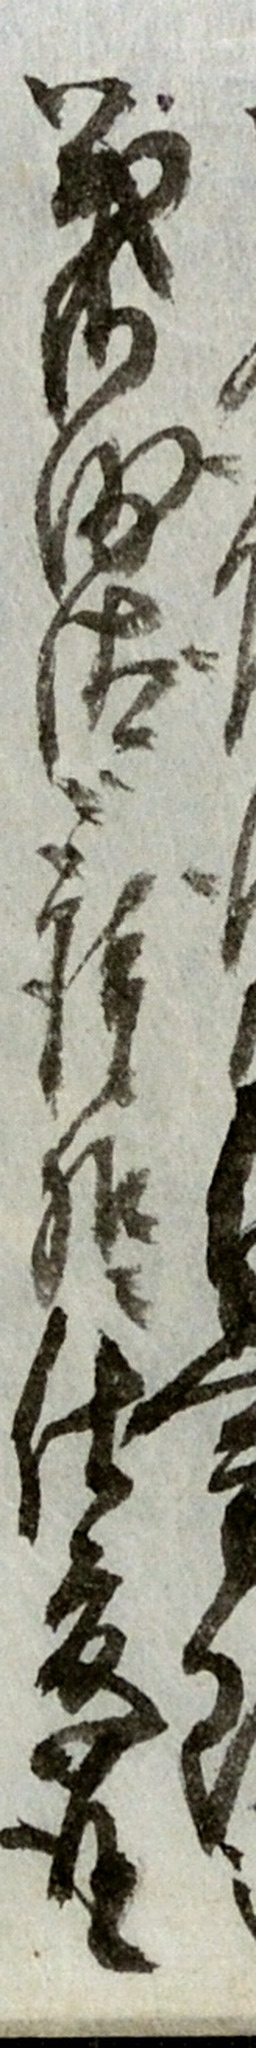義御沙汰御座候様ニ仕度奉存候
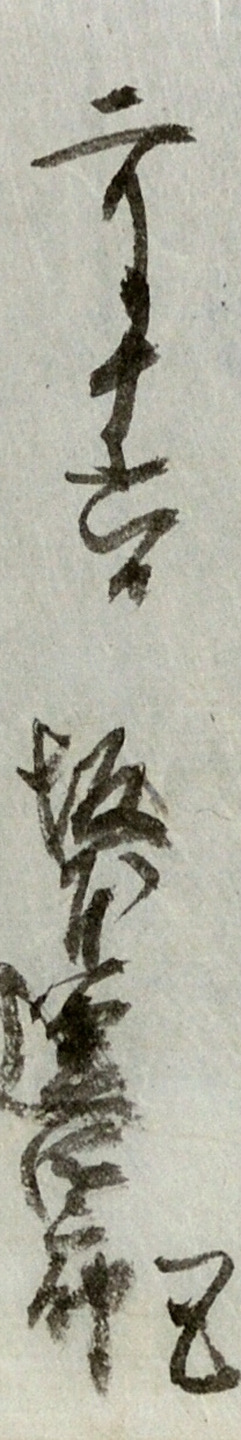二月十六日坂本運四郎
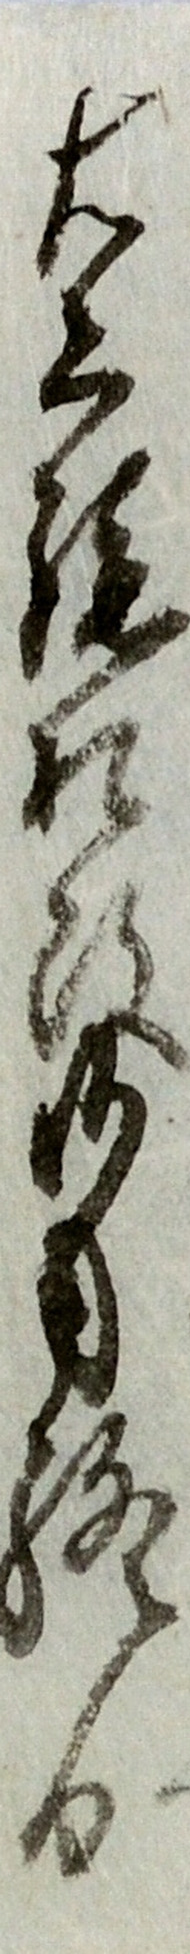右は諸札改御用終日

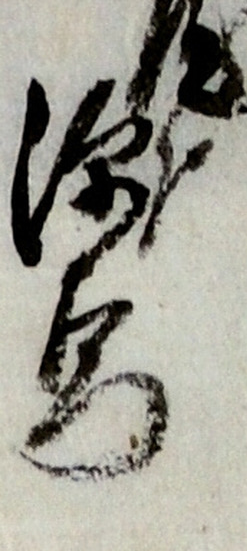源右衛門
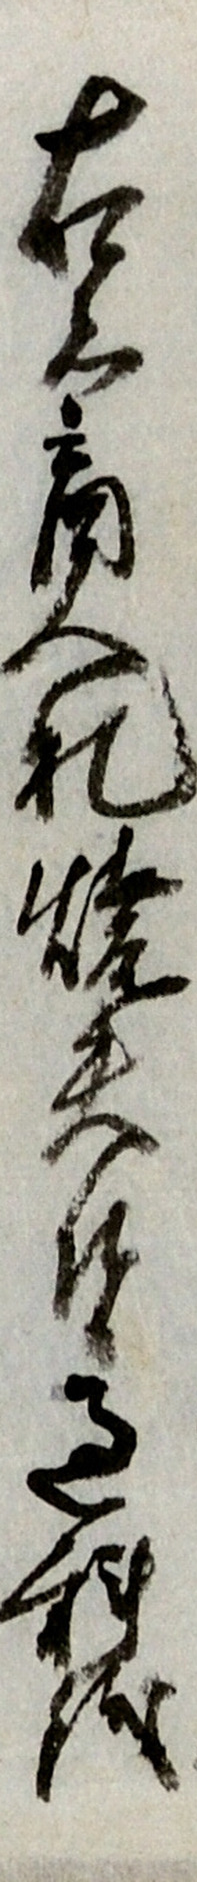右は商人札焼失仕候過料儀
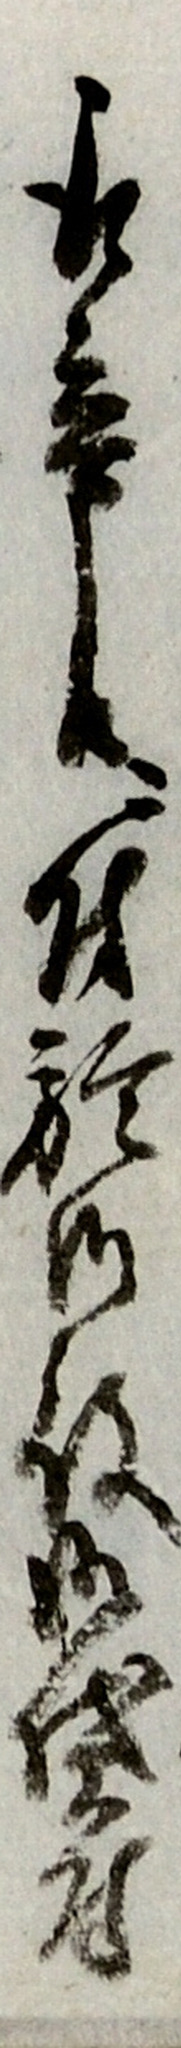取立申候ニ付於御役御貸付
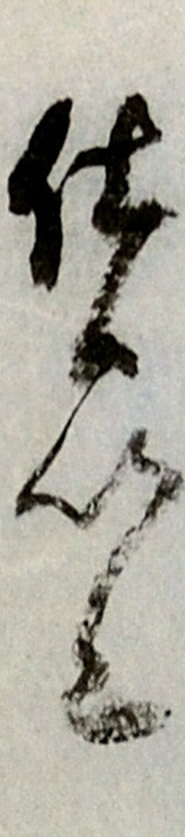仕候以上
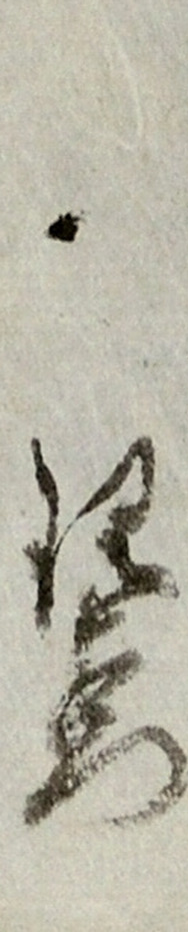源右衛門
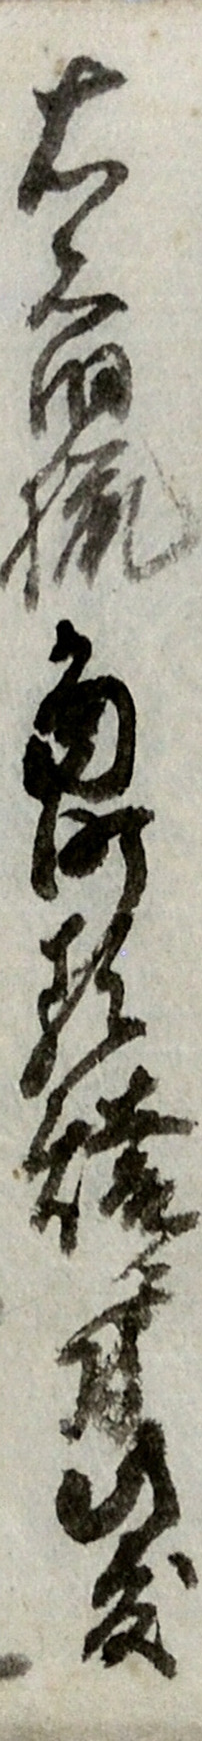右は旧臘当町類焼ニ付此度
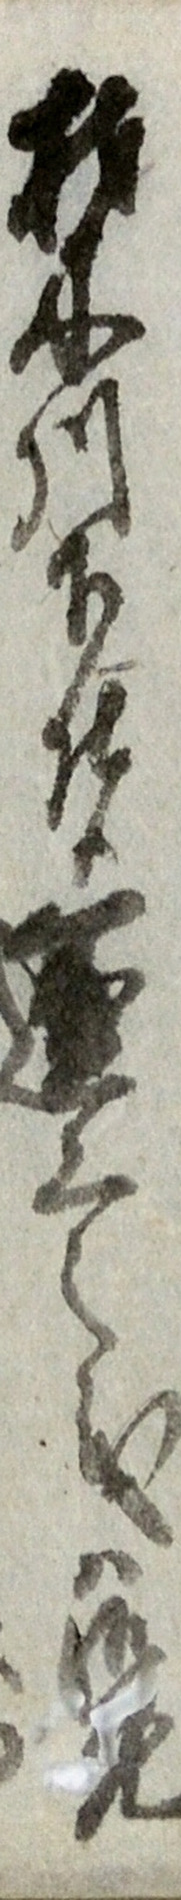材木川下仕候運上之義ハ御免
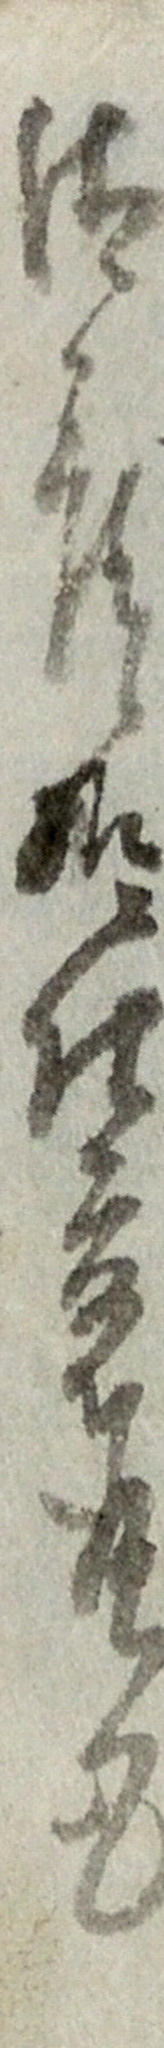汰御座候様ニ仕度奉存候以上
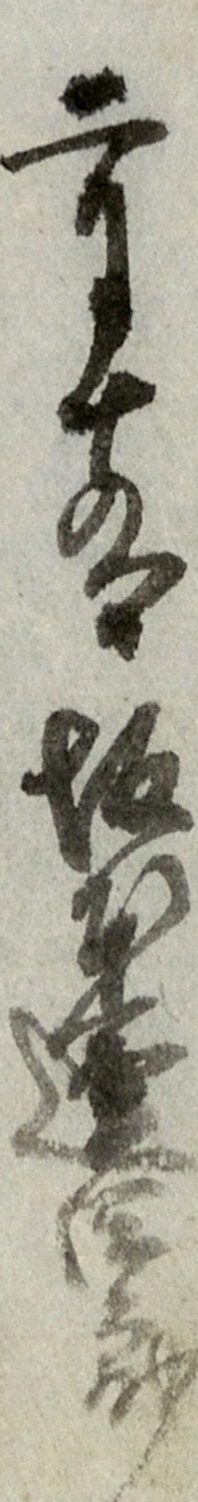二月十九日坂本運四郎
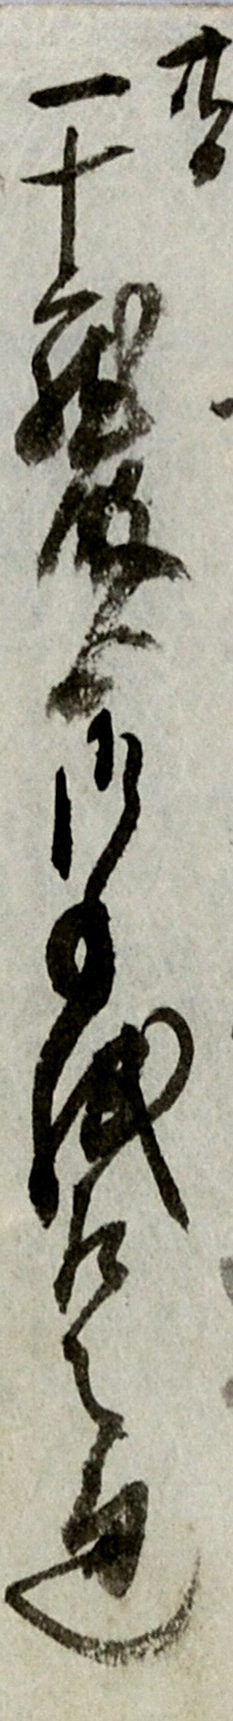一十蔵殿ゟ御手紙左之通
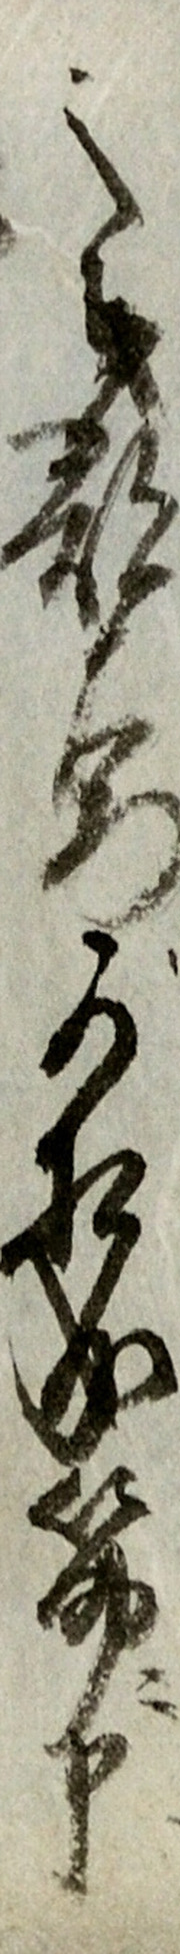之義郡右衛門可相成筋ニ申
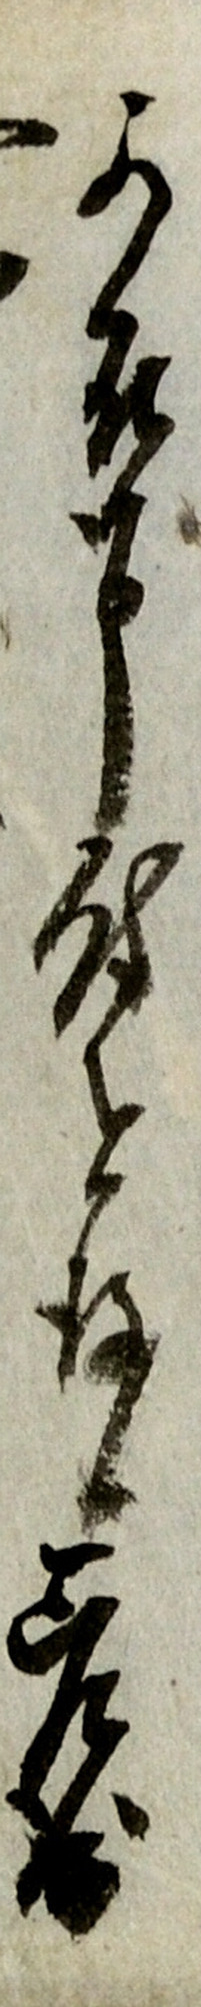可被申付奉存候差出
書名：分一方諸事御用留帳
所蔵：伊那市立高遠町図書館・合同会社AMANE
